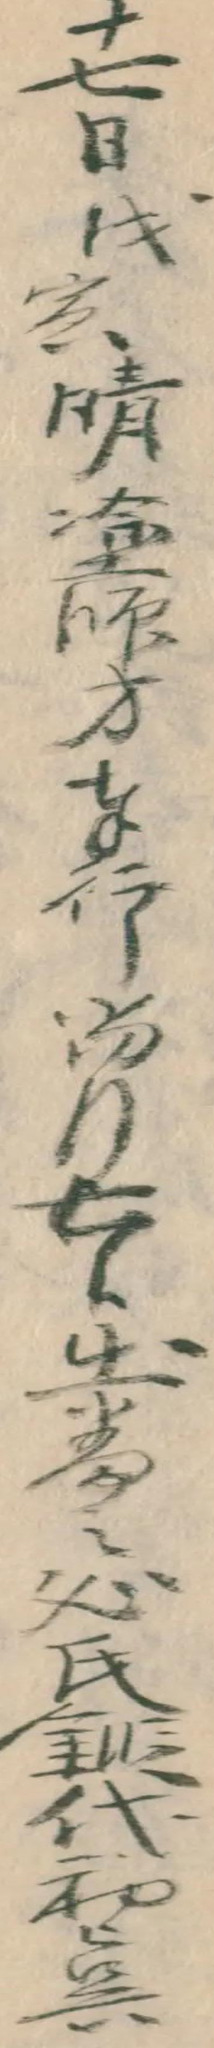十七日戊寅晴塗師方奉行當月七日出番之処氏鍛代勤被呉
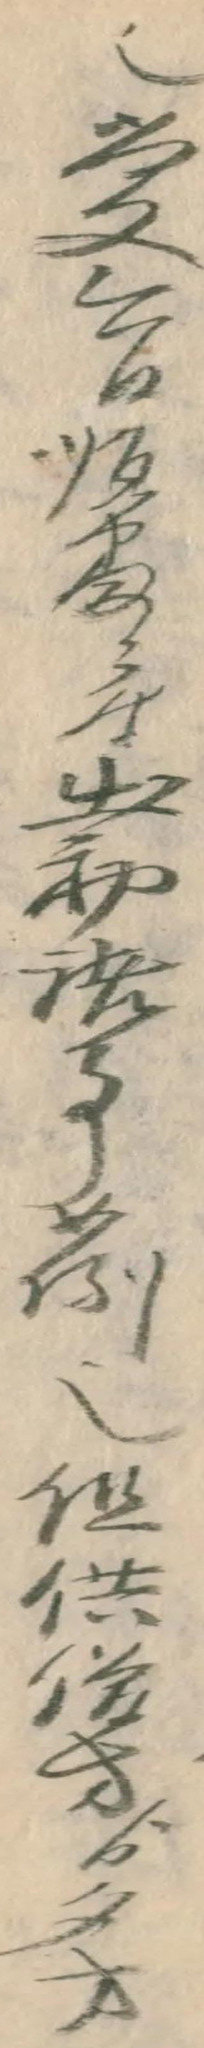也尚又今日順番ニ付出勤諸事如例也但供僧方ゟ夕方
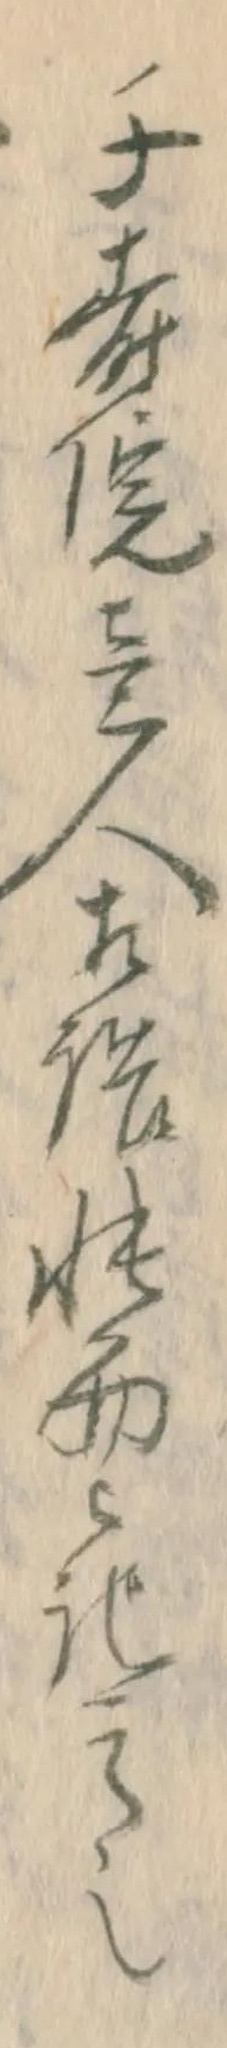千寿院壱人相詰帳面被記之也
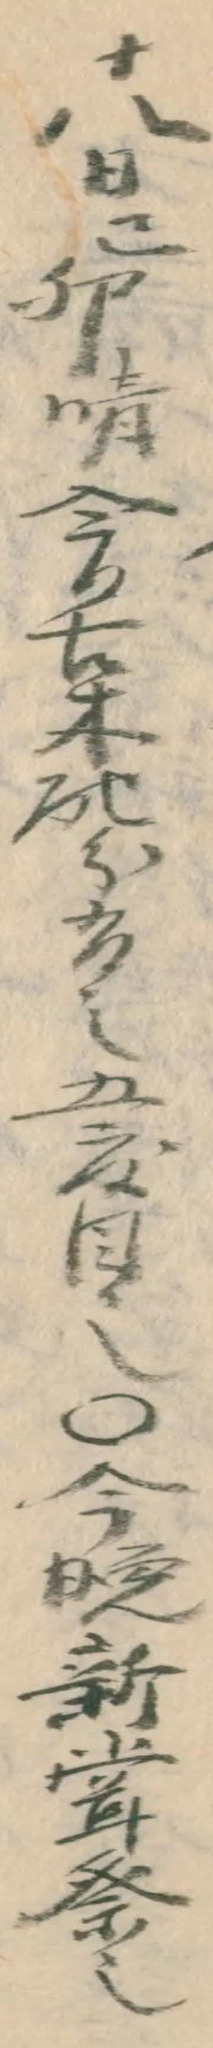十八日己卯晴今日古木配分有之五度目也○今暁新嘗祭也
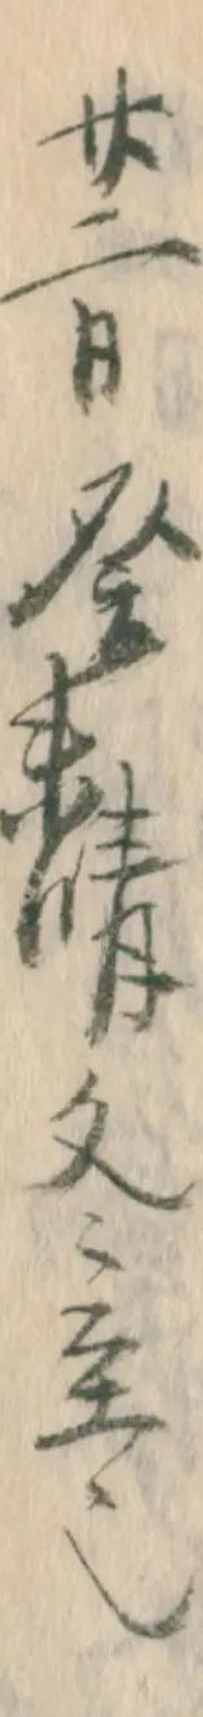廿二日癸亥晴冬至也
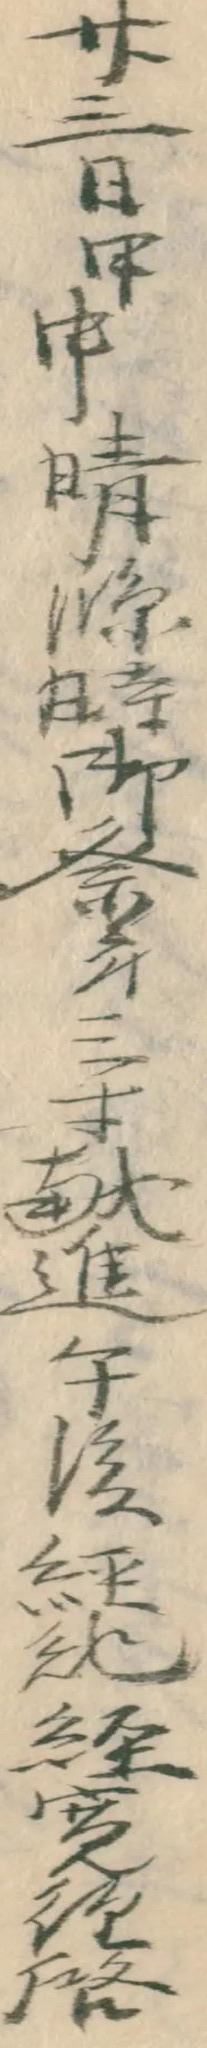廿三日甲申晴臨時御祭ニ付三寸献進午後経紀経寛経啓
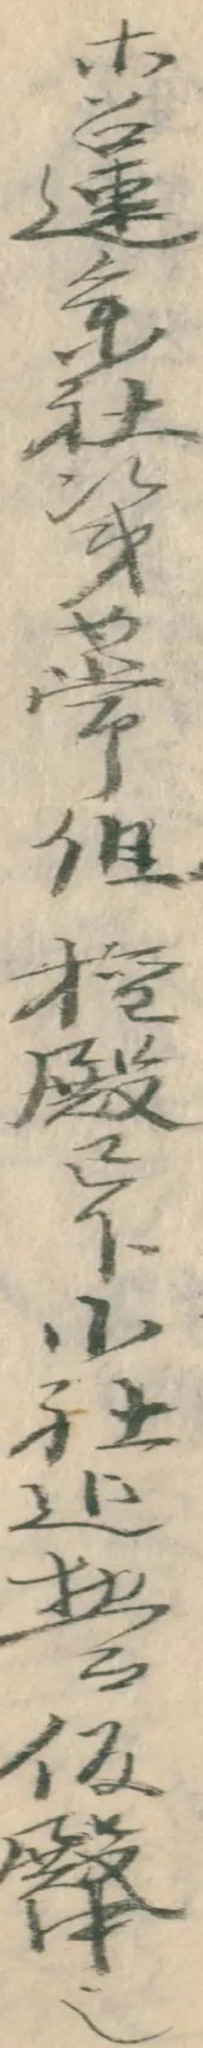等召連参社次第如堂但権殿已下小社迄惣而仮殿中也
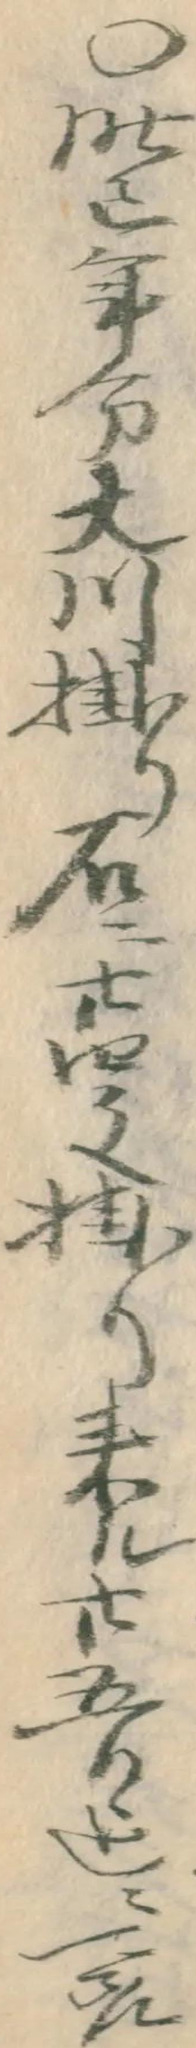○昨巳年分大川掛り石二廿四文掛り来ル廿五日迄二可差

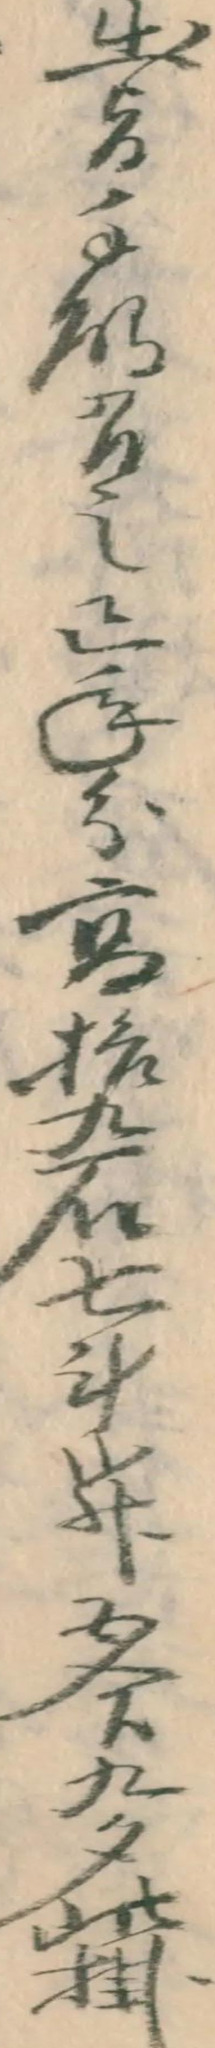出旨手觸有之巳年分高拾九石七斗弐升五合九勺此掛
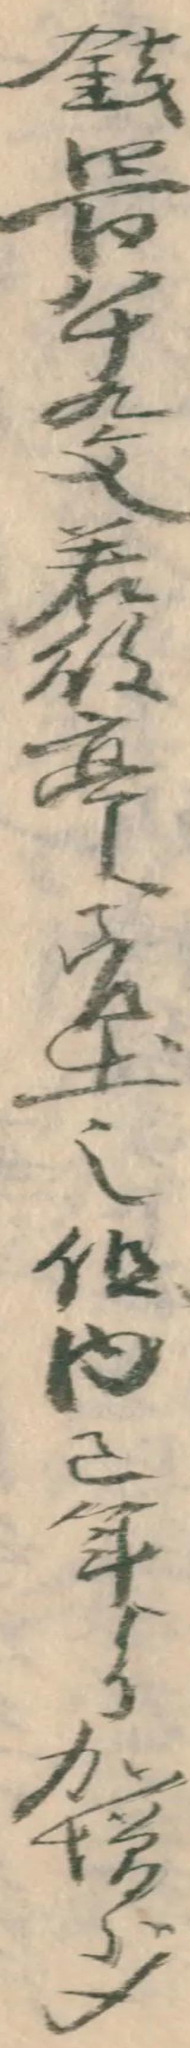銭四百八十九文若役亭へ差出也但内巳年より加増分〆
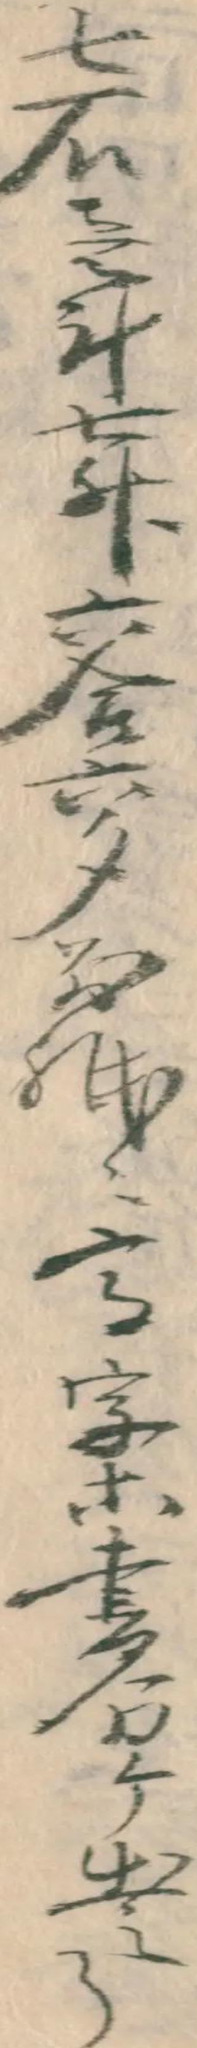七石壱斗七升六合六勺別紙に高字等書分ケ出之了
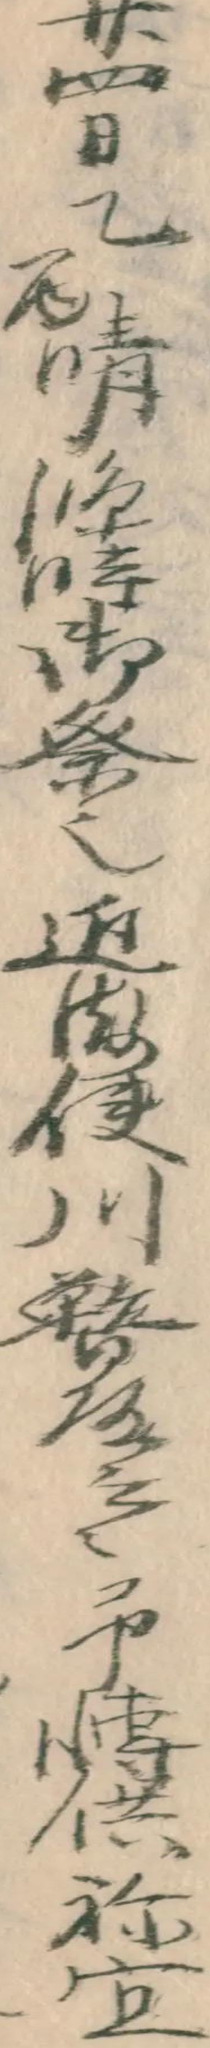廿四日乙酉晴臨時御祭也近衛使川鰭殿ニて予轉供称宜
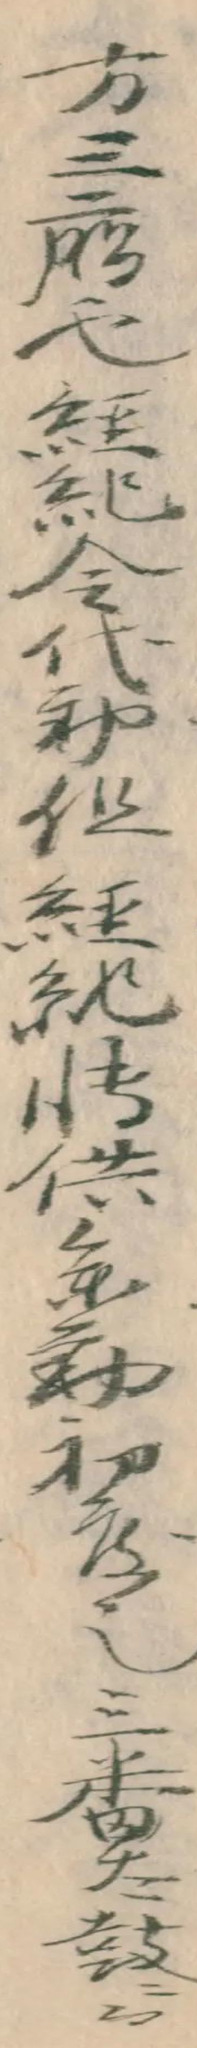方三臈也経紀令代勤但経紀轉供参勤初度也三番太皷ニ而
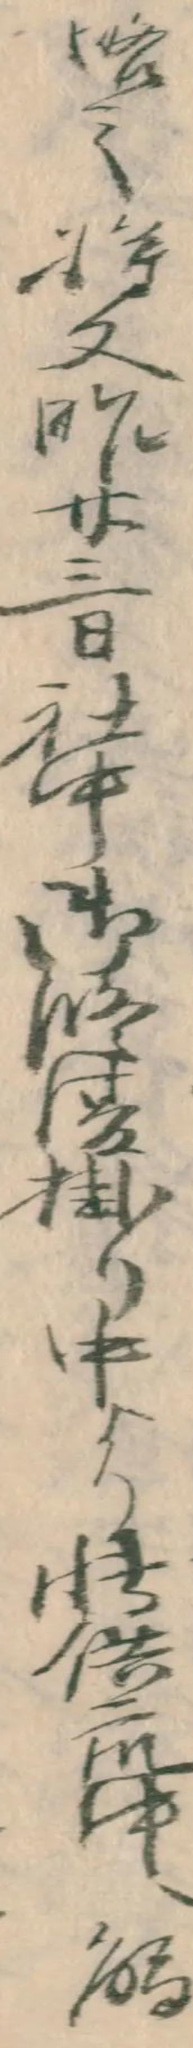略之将又昨廿三日社中御修復掛リ中より轉供衆中へ觸
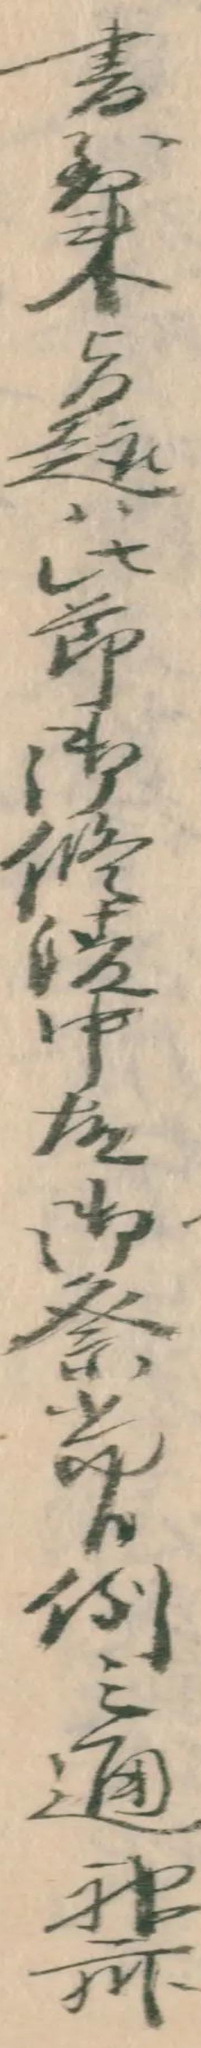書到来旨趣ハ此節御修復中故御祭當日例之通神前
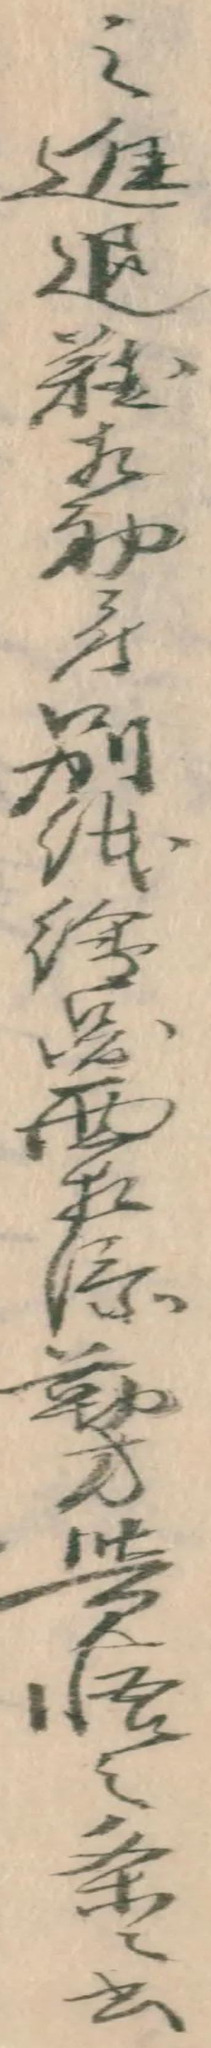之進退難相勤ニ付別繪図面相添勤方覚悟之条ニ書
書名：賀茂社記録. 第66冊
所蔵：国立国会図書館 National Diet Library, JAPAN
